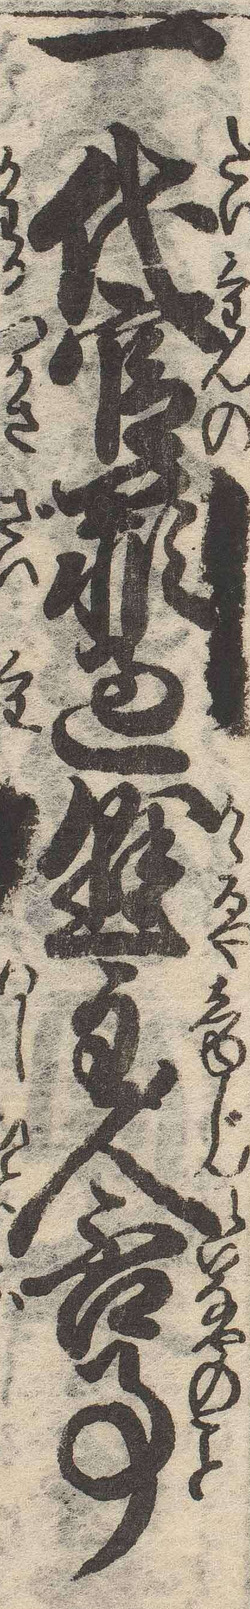一代官罪過懸主人否事
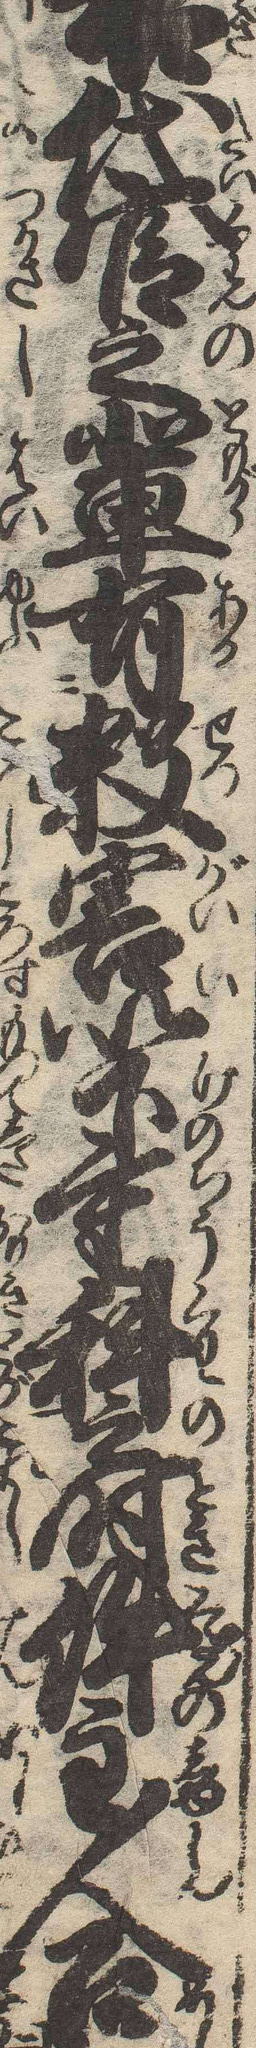右代官之輩有殺害以下重科之時件主人召
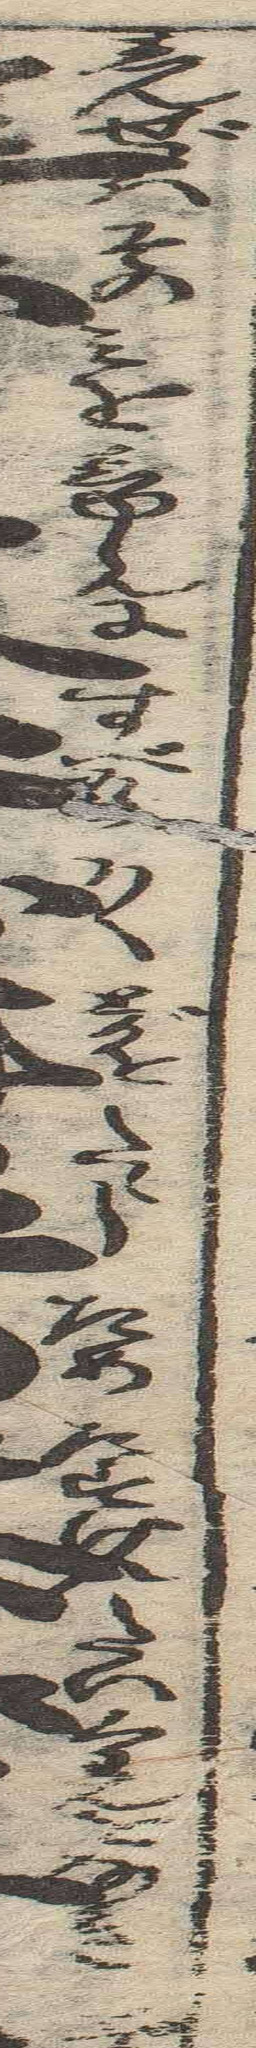しんぜはそのみをしゆしんにすべからすかくとがをたゝしためたすけんたいくわんをなきとが

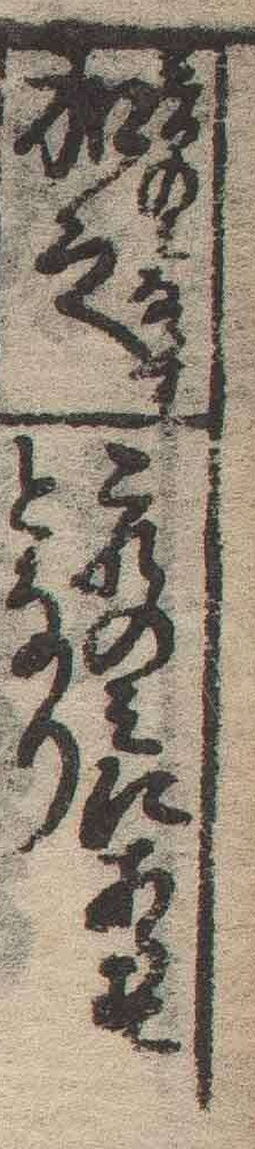加之これのみにあらす
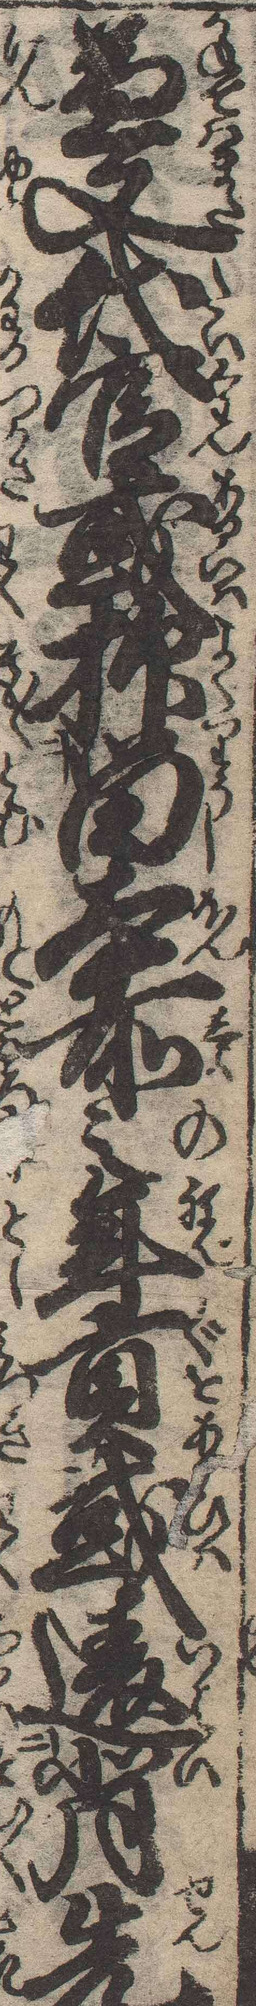兼又代官或抑留本所之年貢或違背先
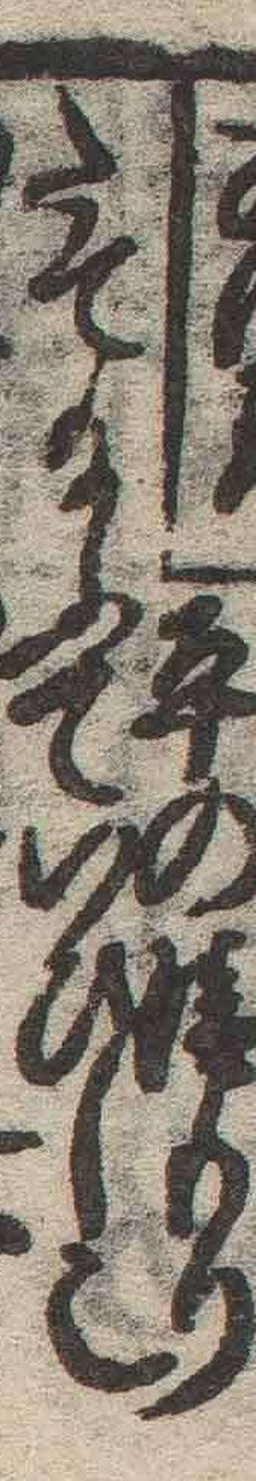たて給ふていひし也
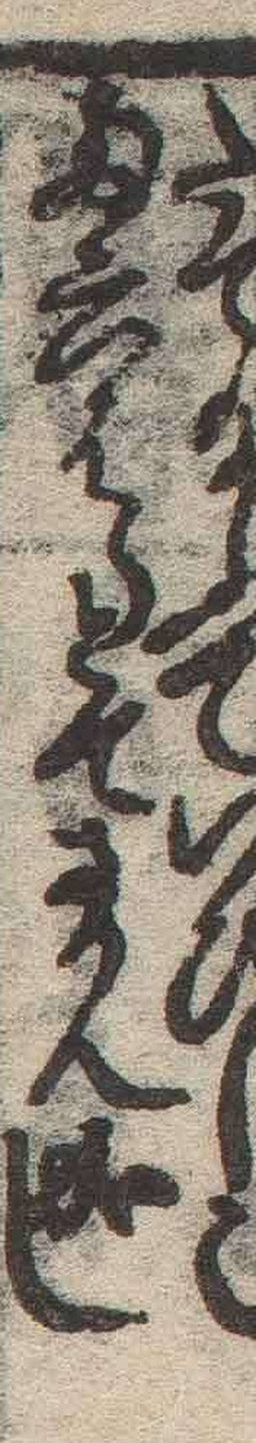両六はらとてさかん成し
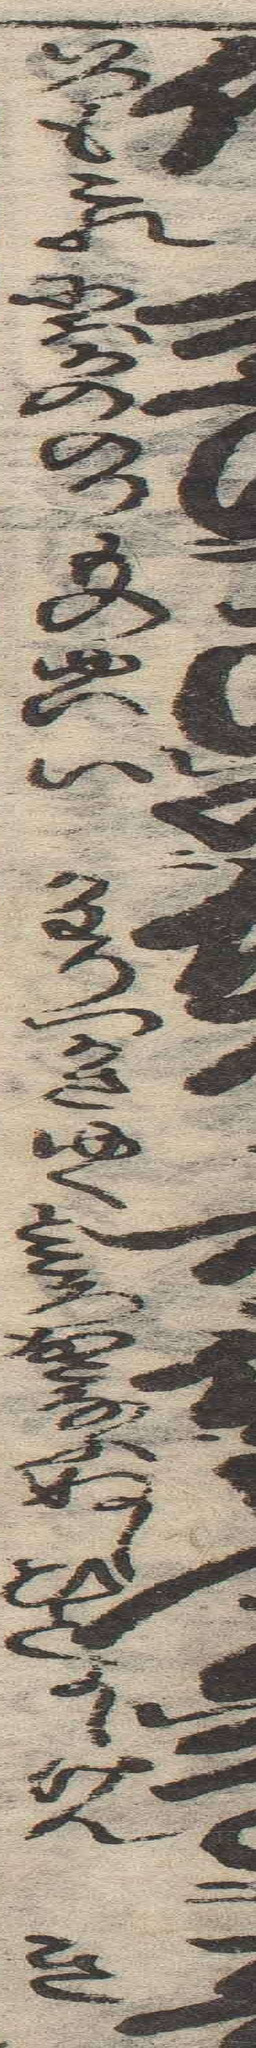いつもこれにはかののりものゆいいかわりつかさゆくところおこなふぬしひとよしけんき
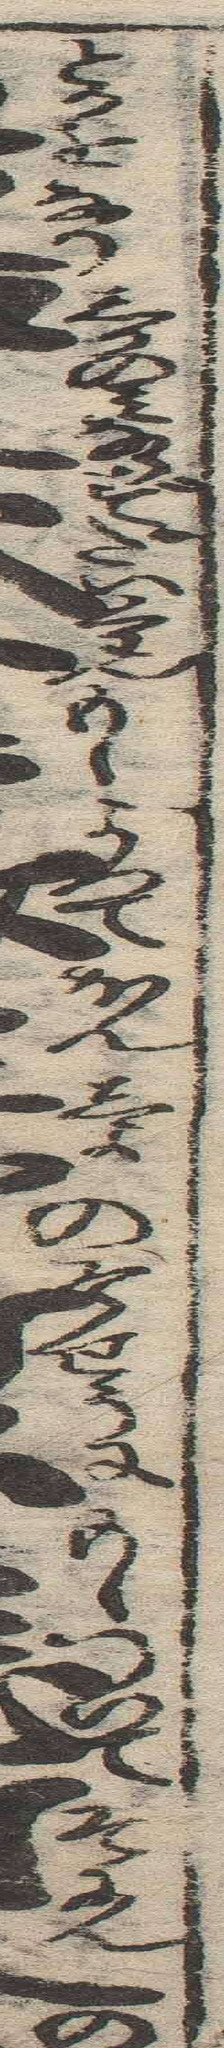とかをなりしかのみならずだいくわんもしよつてほんしよのそせうにもしついてそにんの
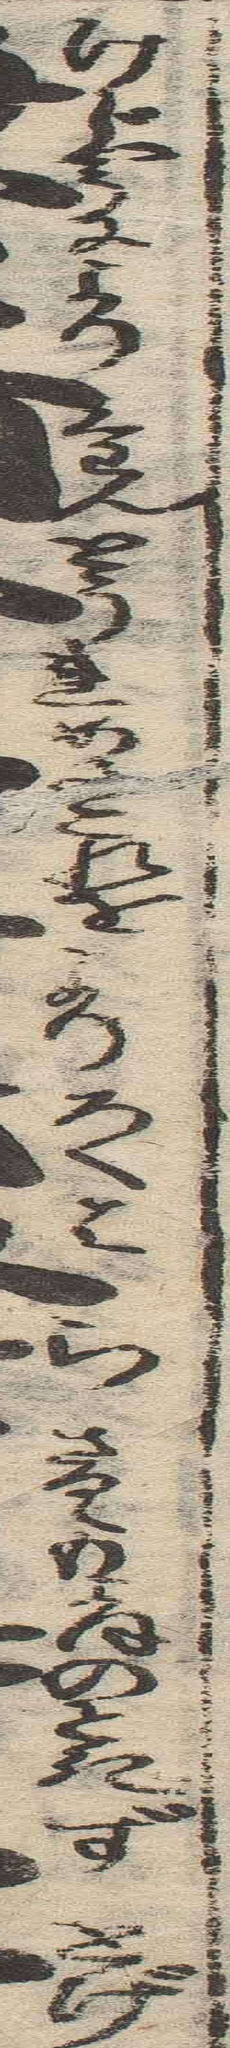けじやうによりくわんとうれめふこれをよりろくはらさるゝもよほのときずとげ
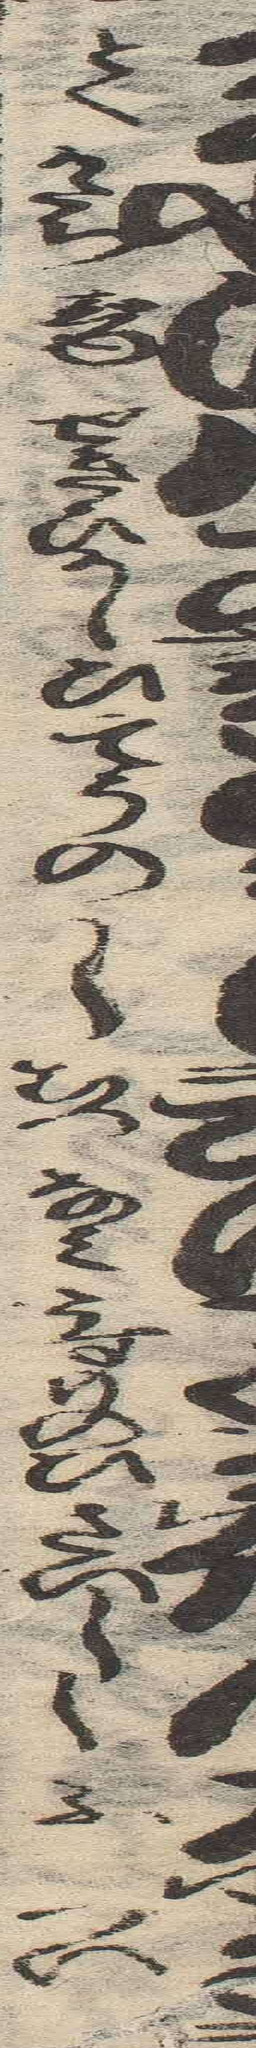とくかたちじゆせきひかしひてうのしむつなみうすものひさいししふつい
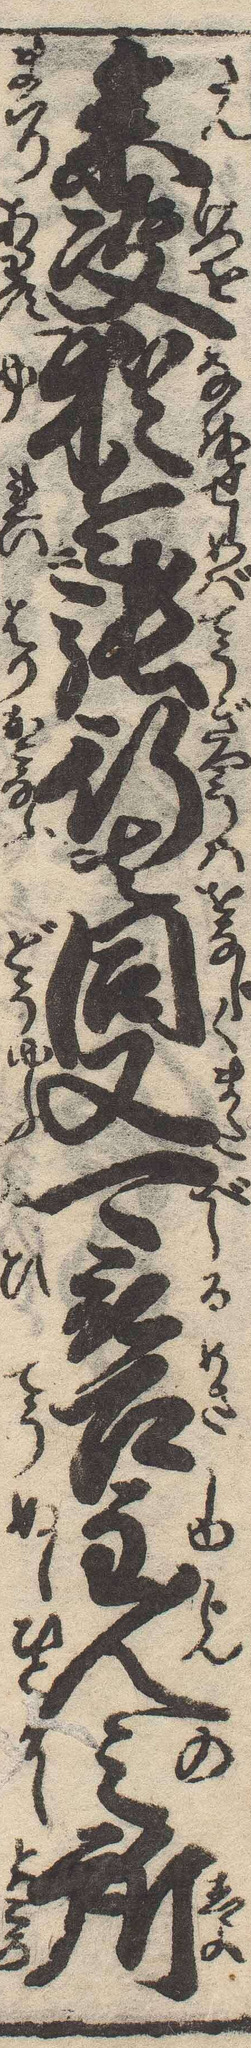参決猶令張行者同又可被召主人之所
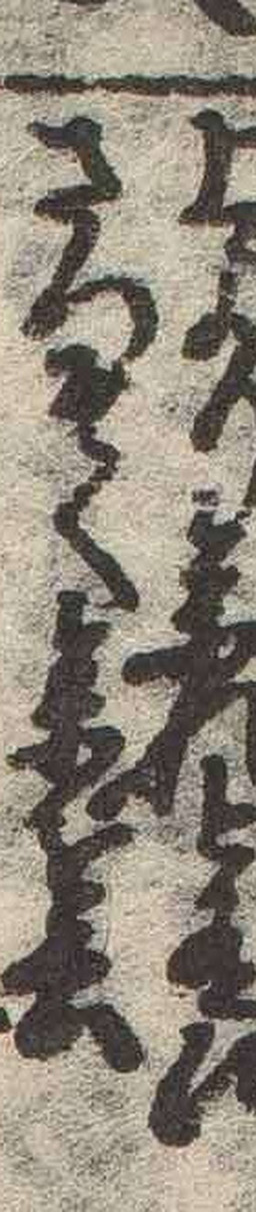さつそく参を云
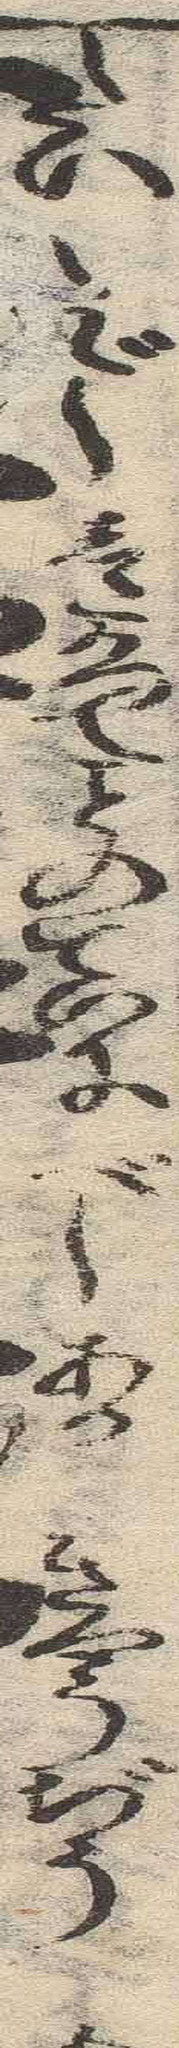たいたゞししたかつてことのていにべしありきやうぢうか
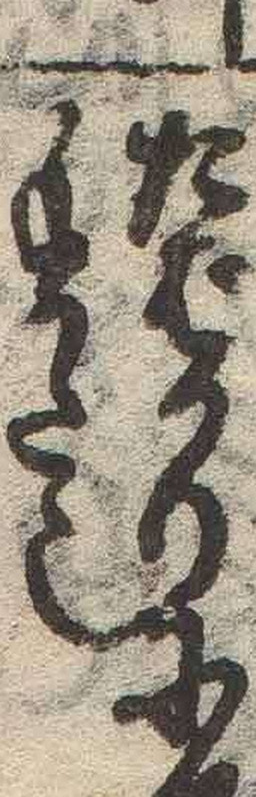手かた也
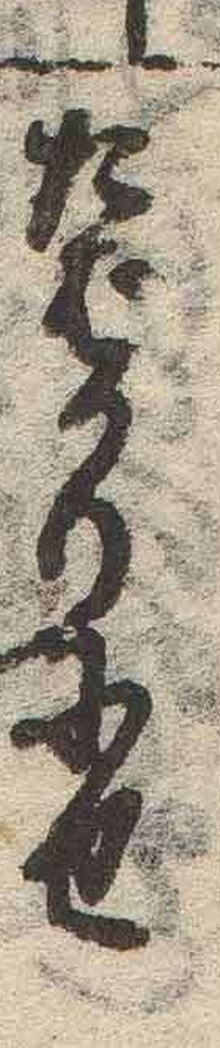謀書たばかりに也
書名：御成敗式目絵抄
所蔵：東京学芸大学附属図書館 国文学研究資料館
